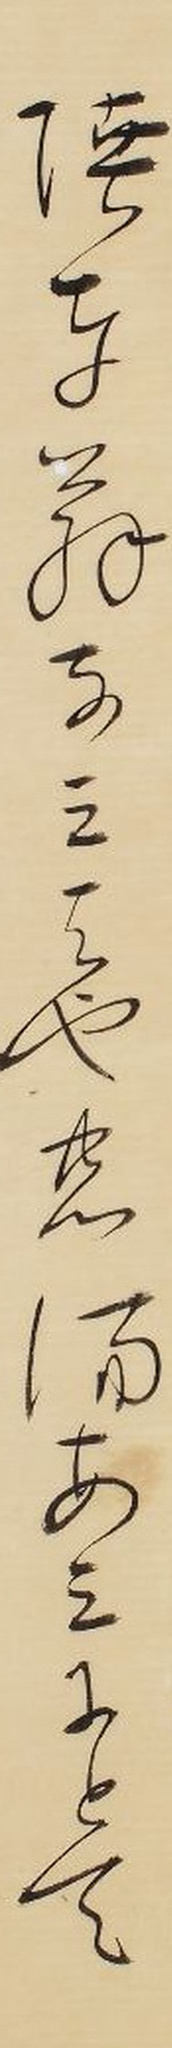陸車翁なみはやの湯あみにとて
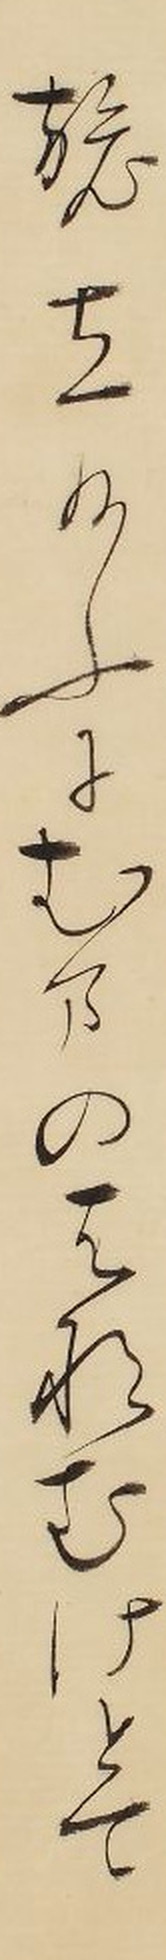旅立給ふにむまのはなむけとて
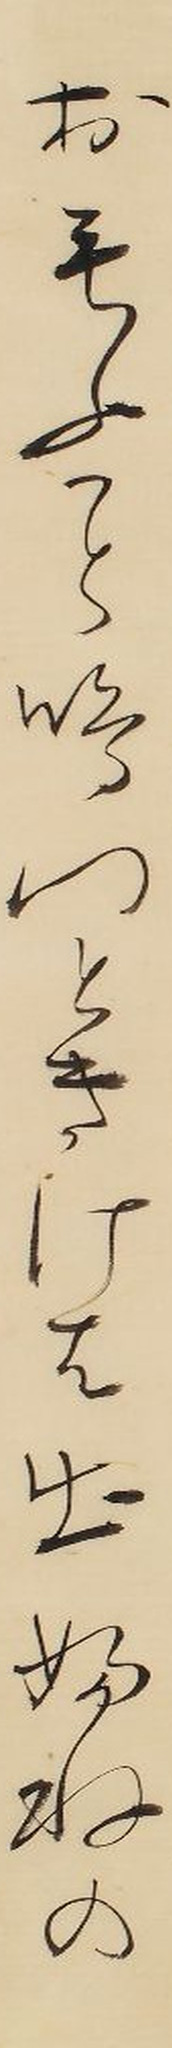おもふこと鳴門ときけは出ふねの
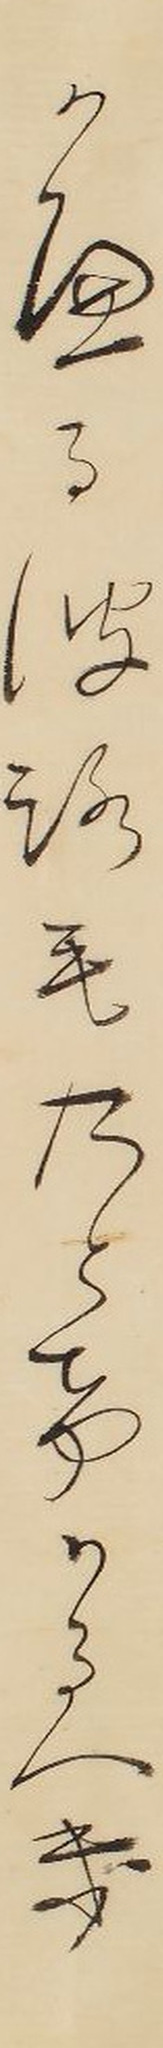かへる波路ものとけかるへき
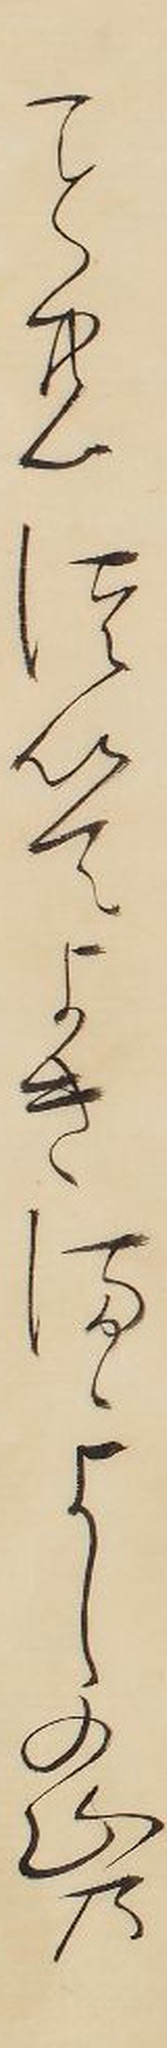ことのついてよきまゝよしの山の
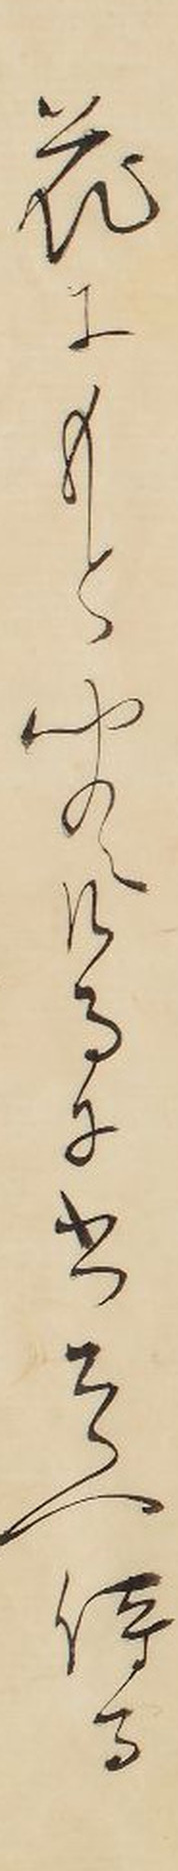花にもと聞えけるに書そへ侍る
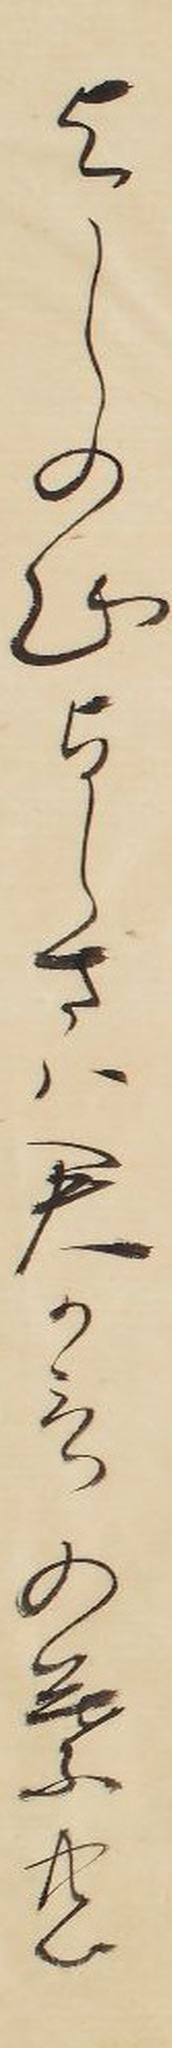よしの山よしさは君か言の葉の
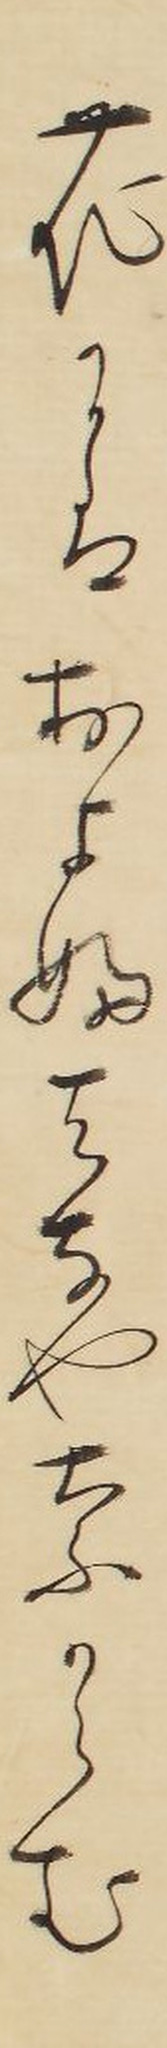花にはおよふはなやなからむ

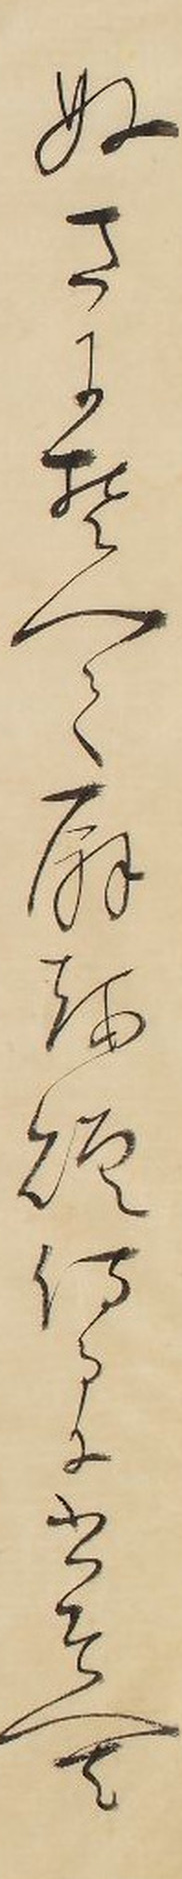ぬさにそへて扇を贈侍るに書そへて
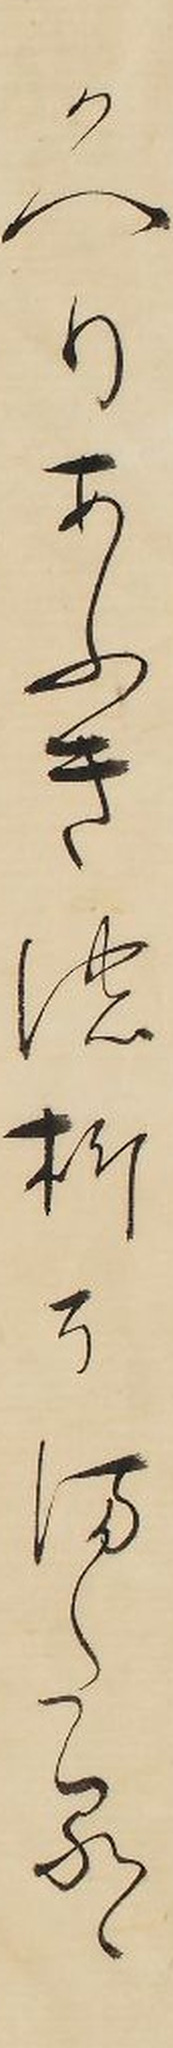かへりあふきの折そまたるゝ
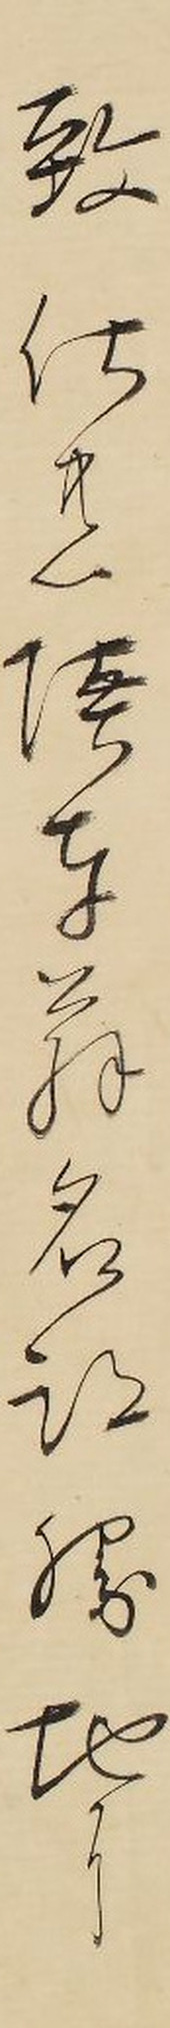致仕の陸車翁名跡勝地に
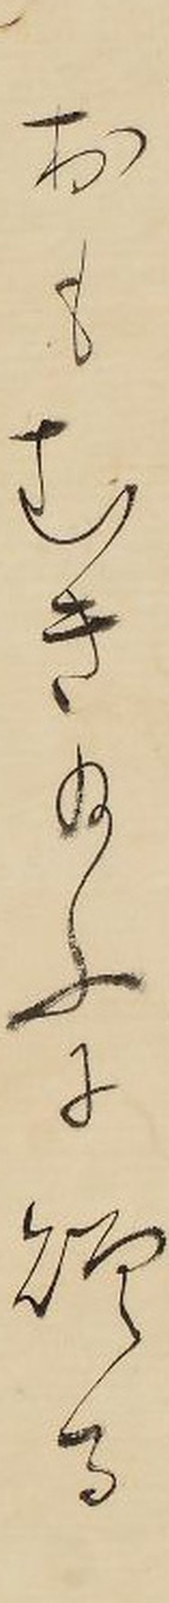おもむき給ふに贈る
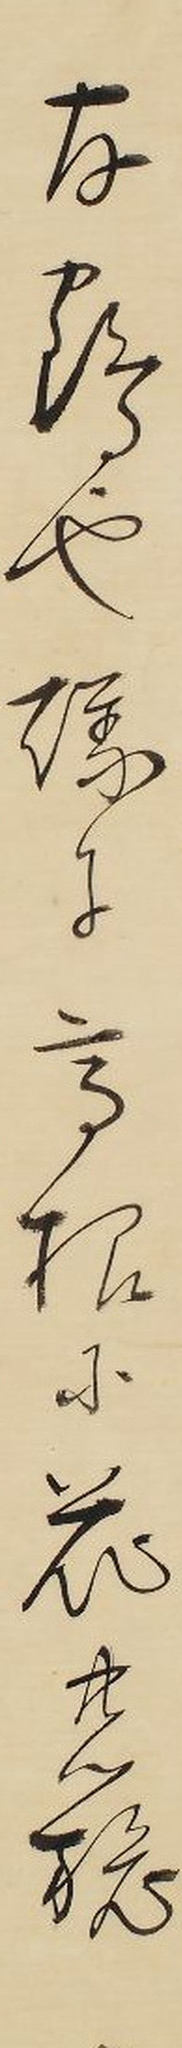友鶴や磯に高根に花の旅
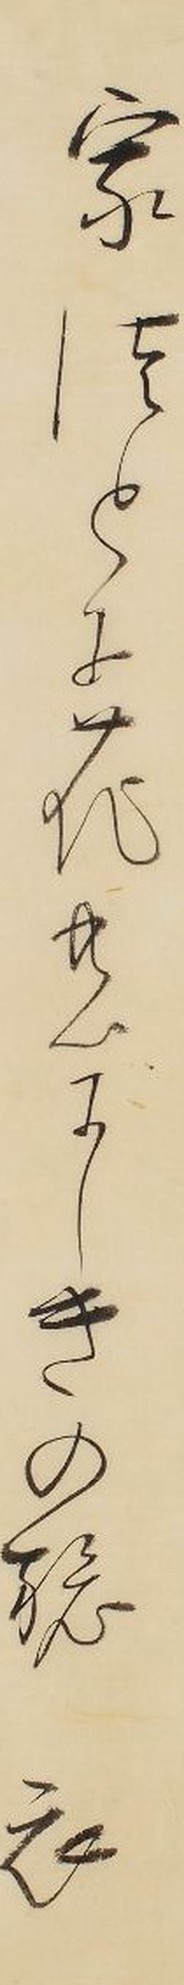家つとに花のにしきの旅衣
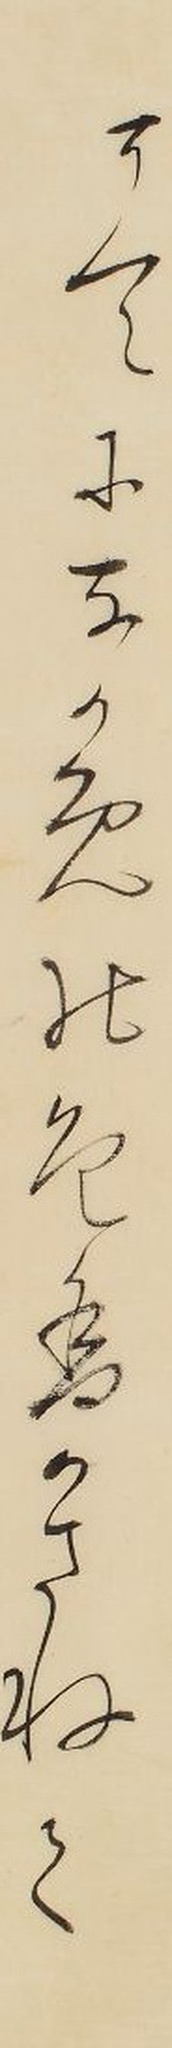そてになかめの色香かさねて
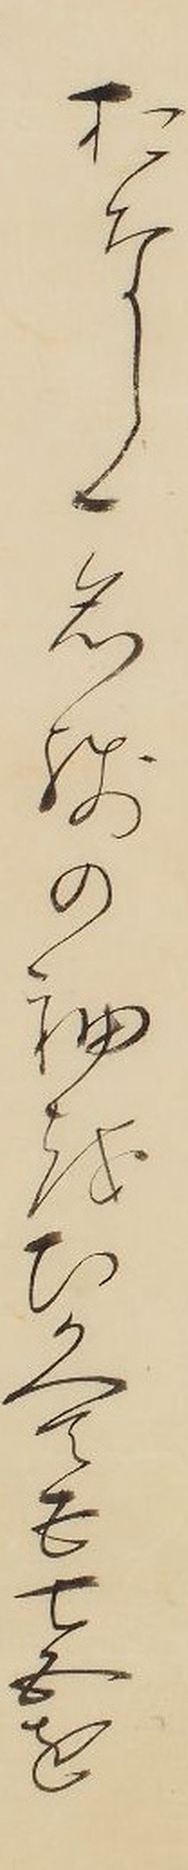おなしく名残の袖をひかへて五七五を
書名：花土産
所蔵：徳島県立図書館
